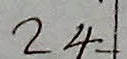24
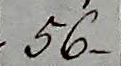56
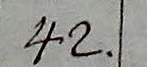42.
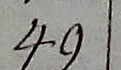49
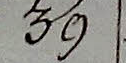39
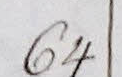64
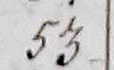53
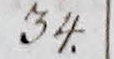34.
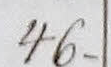46
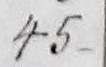45
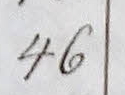46
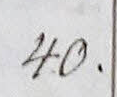40
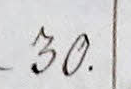30.
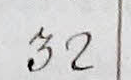32
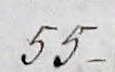55
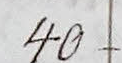40
